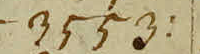3553:
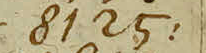8125:
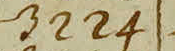3224
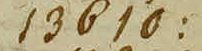13610
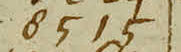8515
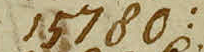15780
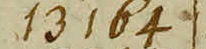13164
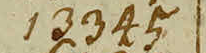13345
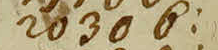20306
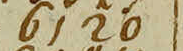6120
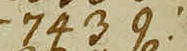7439
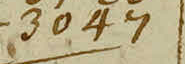3047
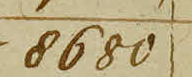8680
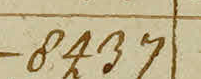8437
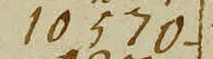10570
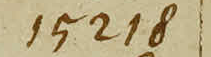15218
